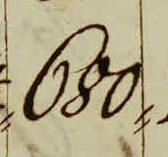680
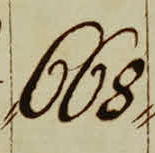668
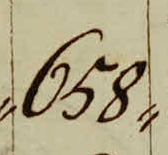658
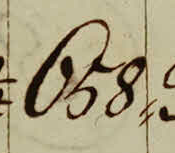658
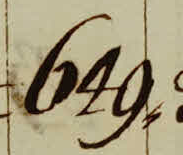649
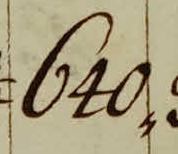640
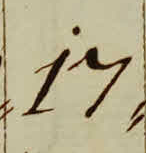17
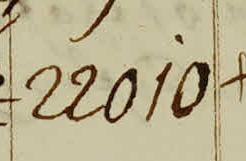22010
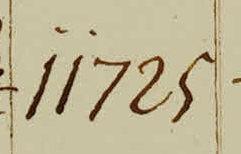11725
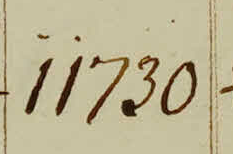11730
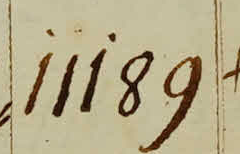11189
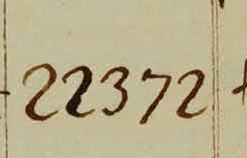22372
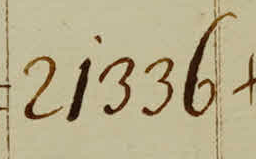21336
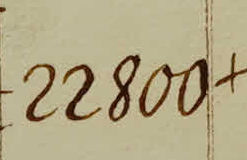22800
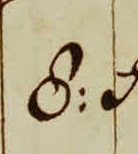8:
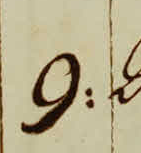9:
